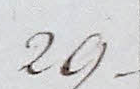29
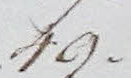49
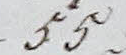55
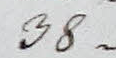38
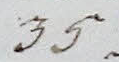35
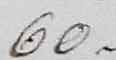60
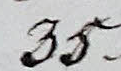35
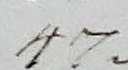47
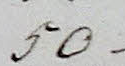50
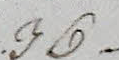36
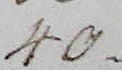40
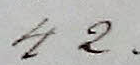42
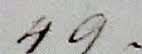49
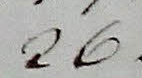26
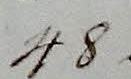48
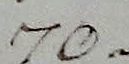70
